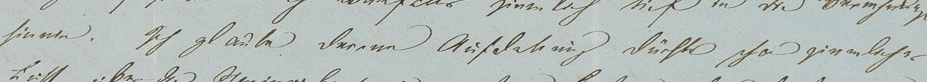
hinein. Ich glaube deren Aufdeckung dürfte schon ziemliches
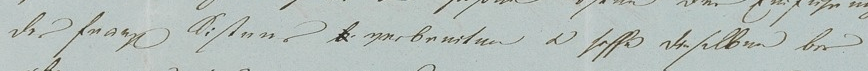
des französischen Sistems b. verbreiten & hoffe dieselben bis
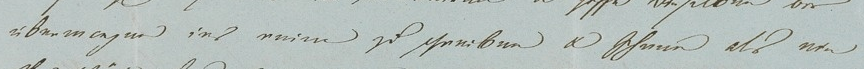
übermorgen ins reine zu schreiben & Ihnen als ein
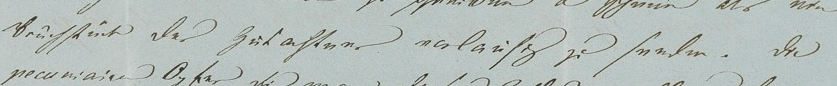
Bruchstück des Gutachtens vorläufig zu senden. Die
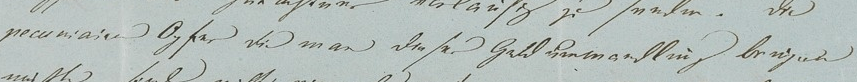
pecuniairen Opfer die man dieser Geldumwandlung bringen
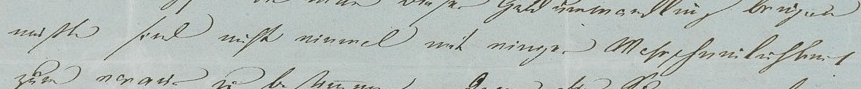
müßte sind nicht einmal mit einiger Wahrscheinlichkeit
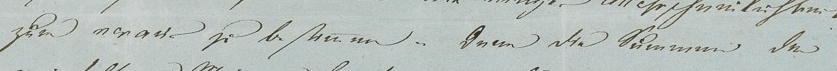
zum voraus zu bestimmen – Denn die Summen der
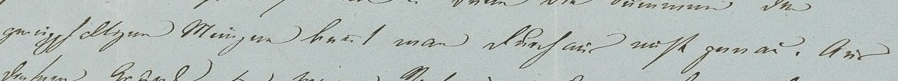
geringhaltigen Münzen kennt man durchaus nicht genau. Aus
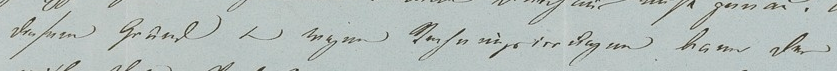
diesem Grund & wegen Rechnungsirrungen kann der
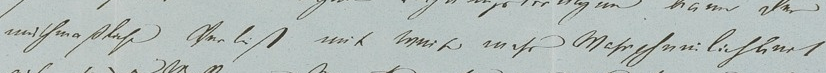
muthmaßliche Verlust mit weit mehr Wahrscheinlichkeit
